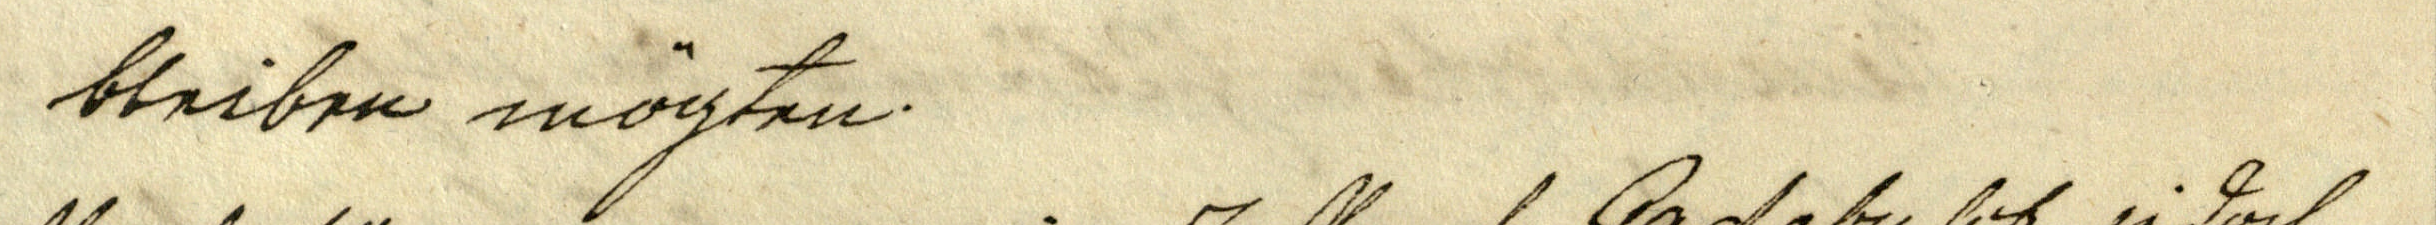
bleiben mögten.
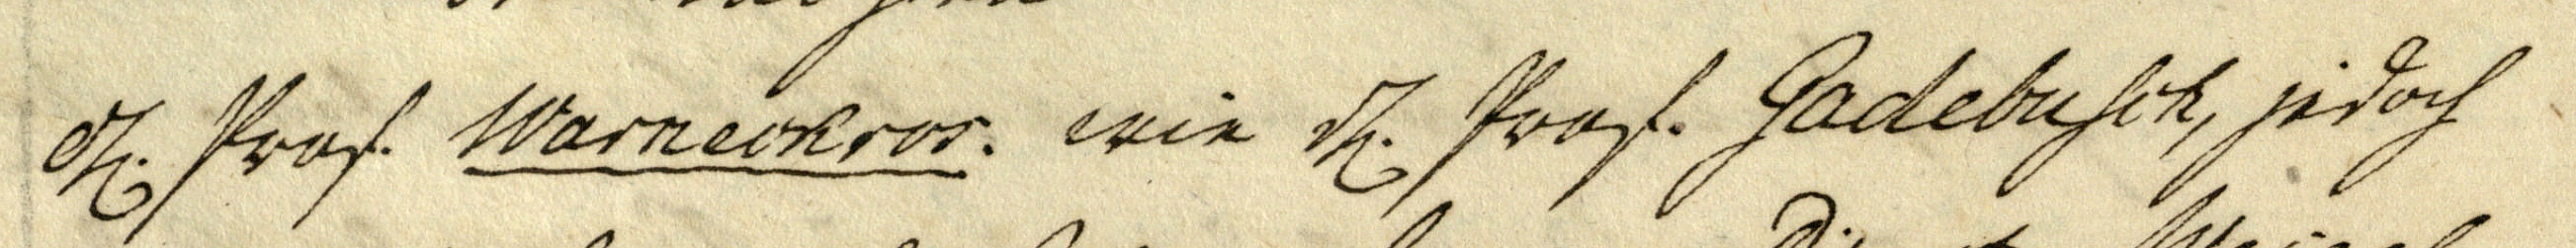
dh. Prof. Warneckros. Wie dh. Prof. Gadebusch, jedoch
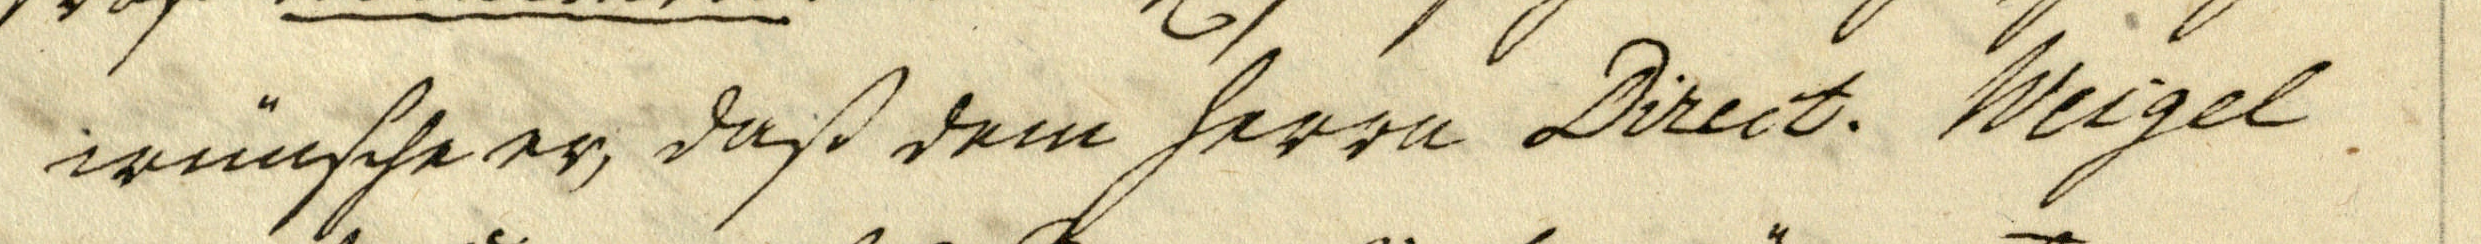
wünsche er, daß dem herrn Direct. Weigel
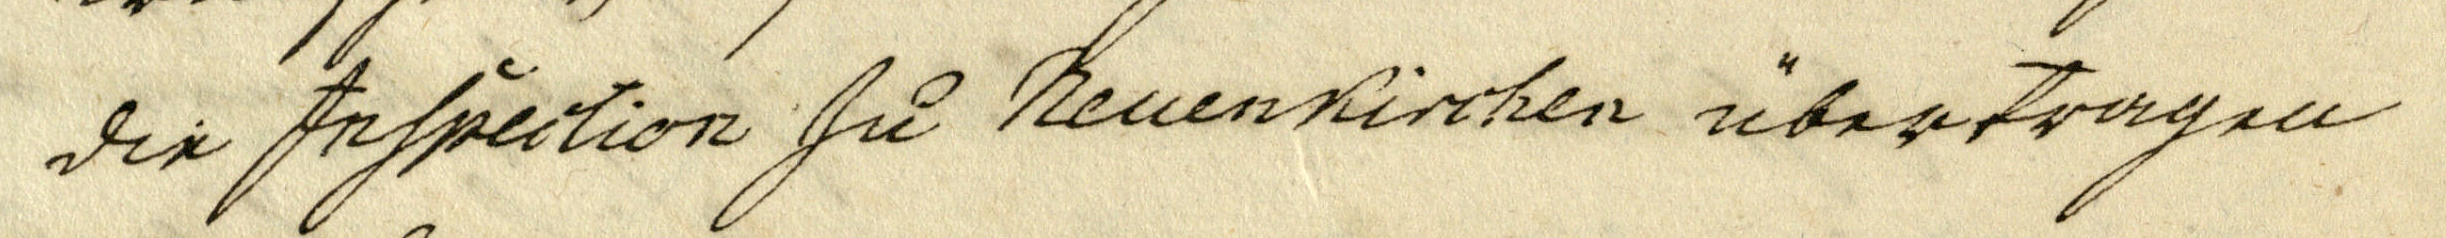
die Inspection zu Neuenkirchen übertragen
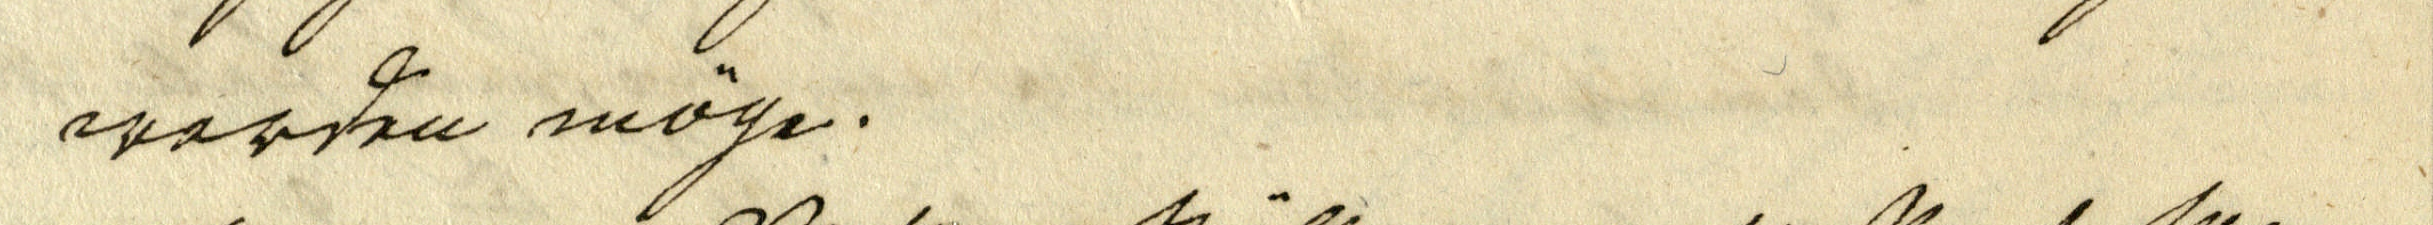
werden möge.
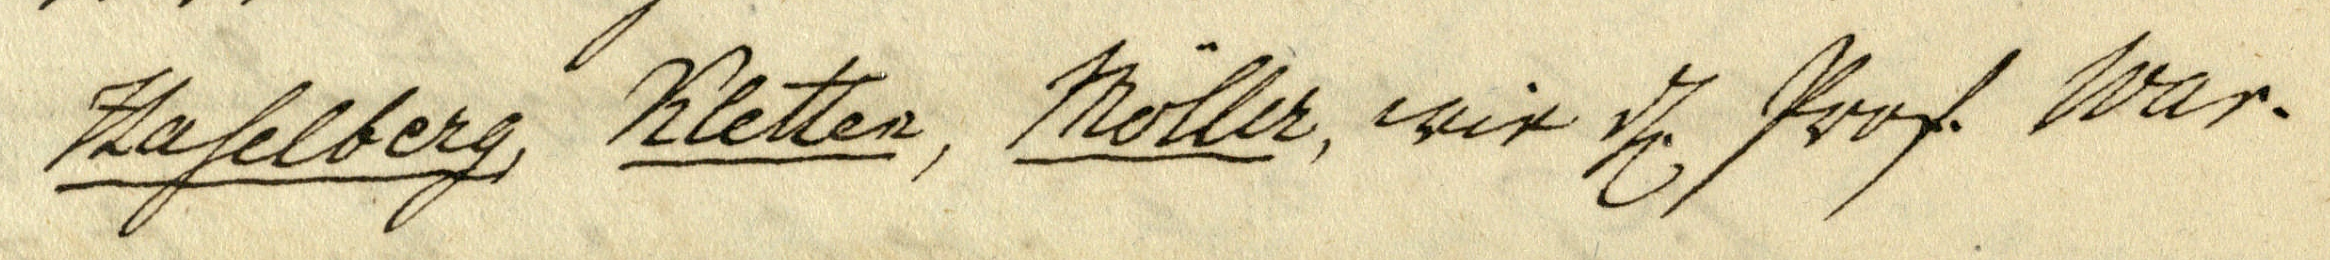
- - Haselberg, Kletten, Möller wie dh. Prof. War-
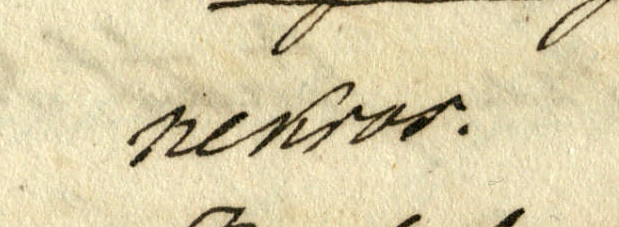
nekros.
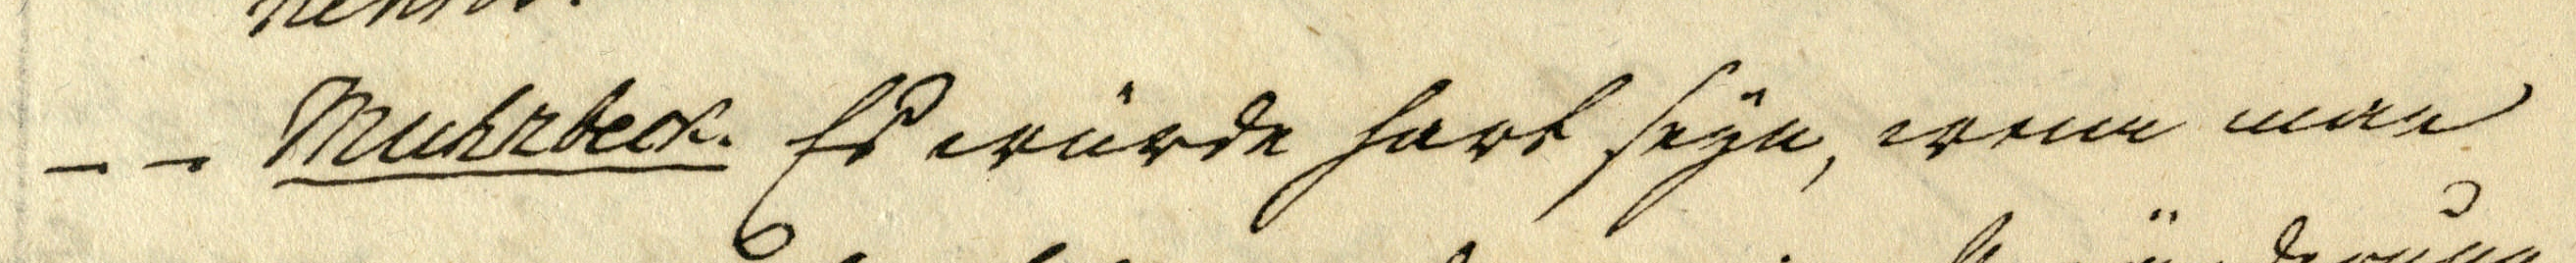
- - Muhrbeck. Es Würde hart seyn, wenn man
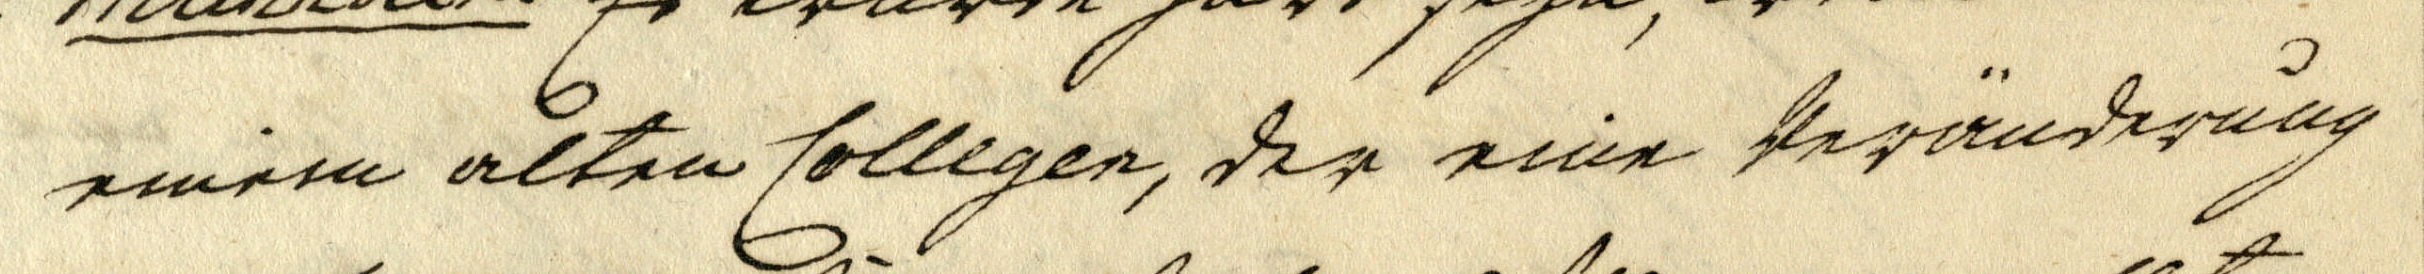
einem alten Collegen, der eine Veränderung
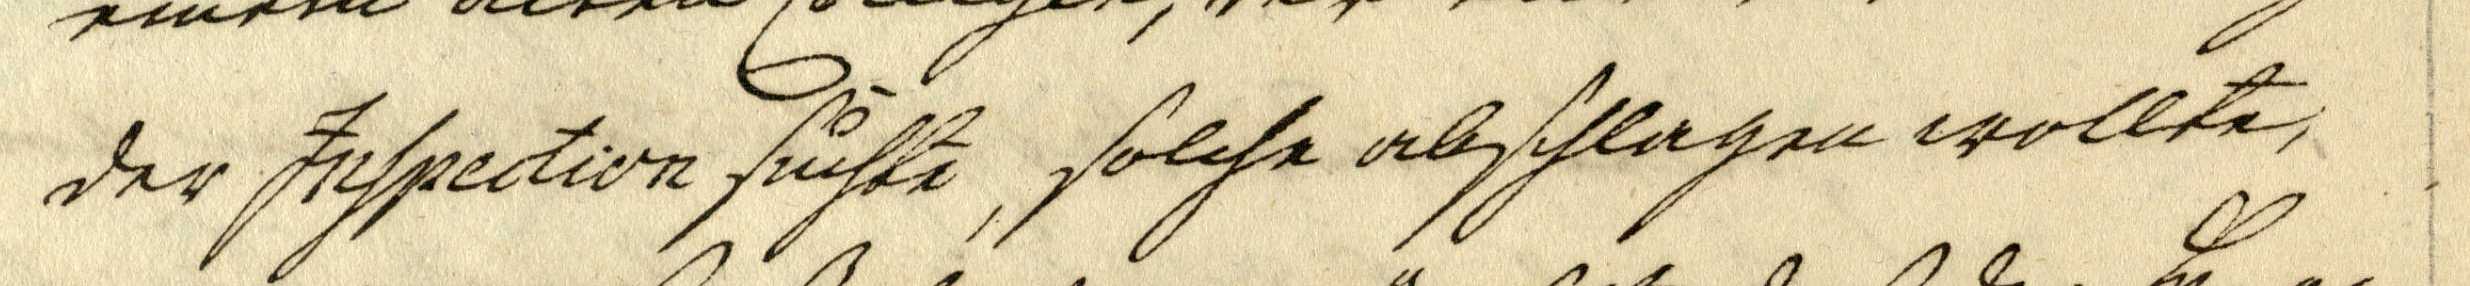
der Inspection suchte, solche abschlagen wollte,
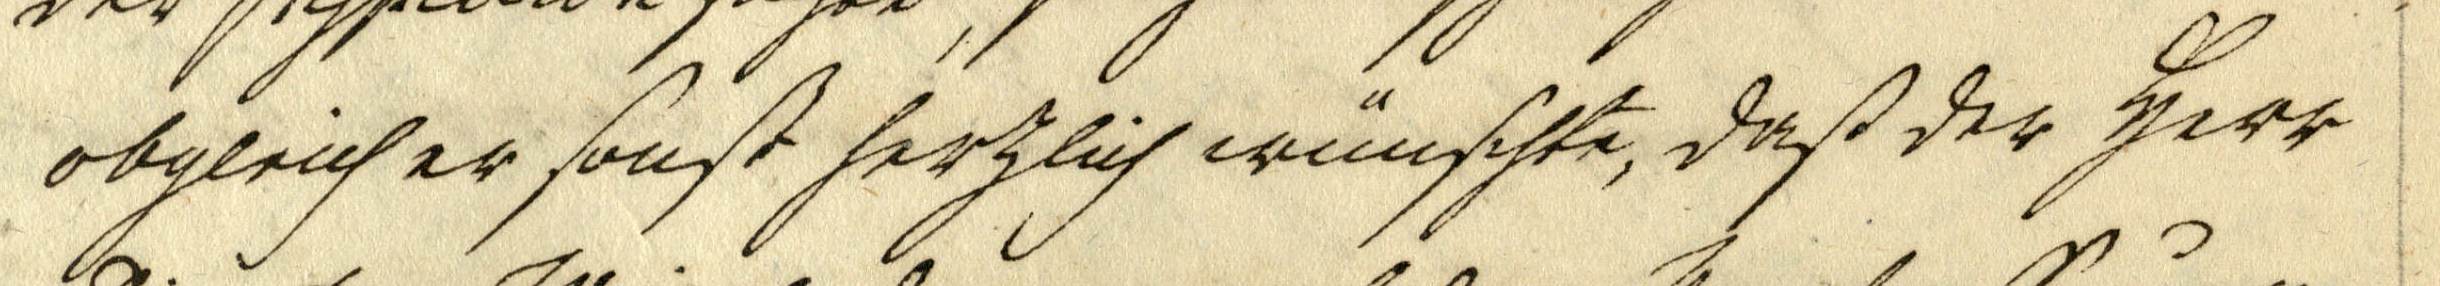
obgleich er sonst herzlich wünschte, daß der Herr
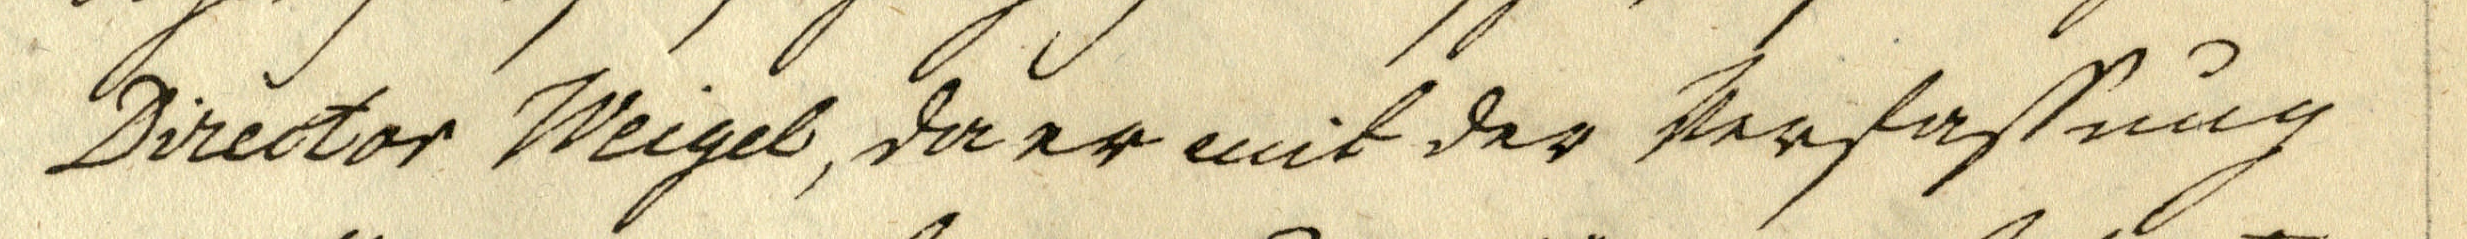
Director Weigel, da er mit der Verfassung
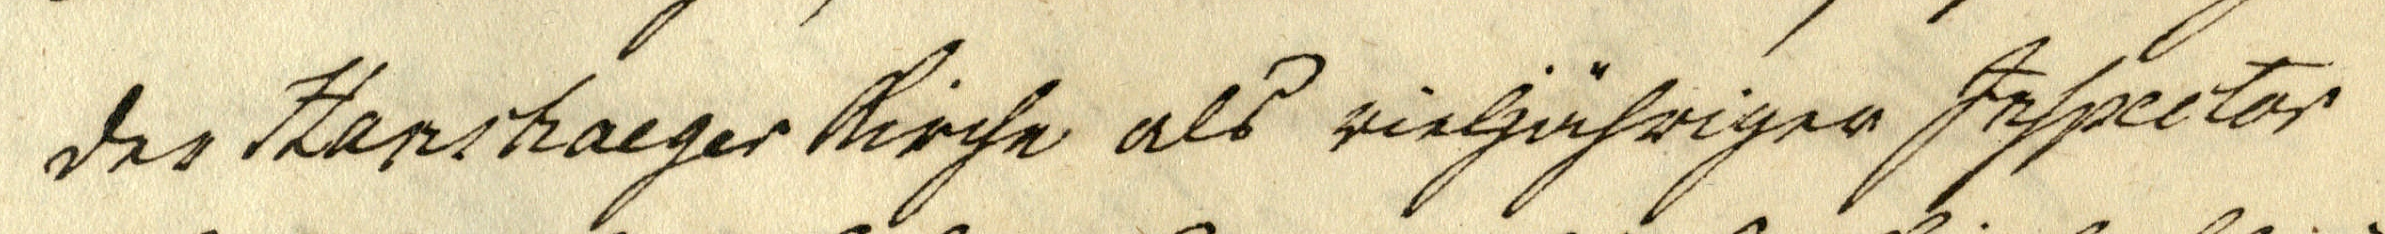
der Hanshaeger Kriche als vieljähriger Inspector
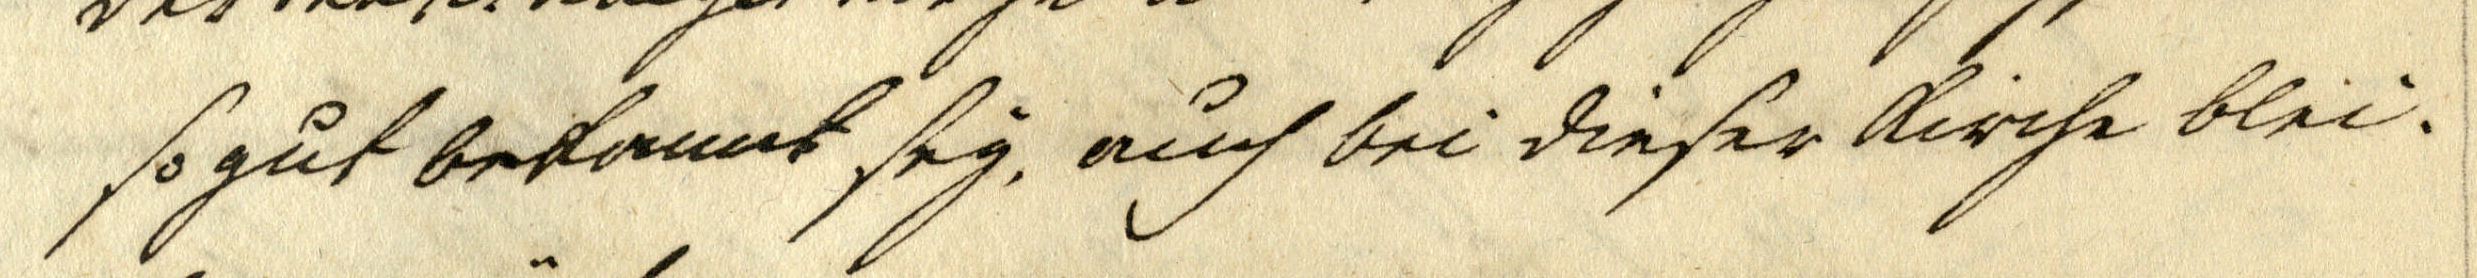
so gut bekannt sey, auch bei dieser Kirche blei-
